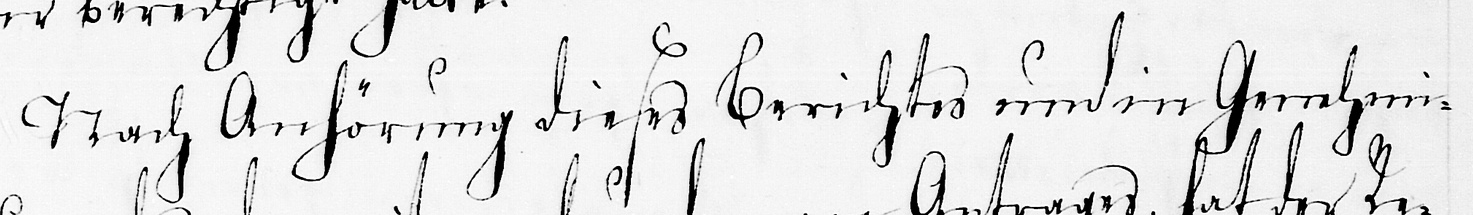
Nach Anhörung dieses Berichtes und in Genehmi¬
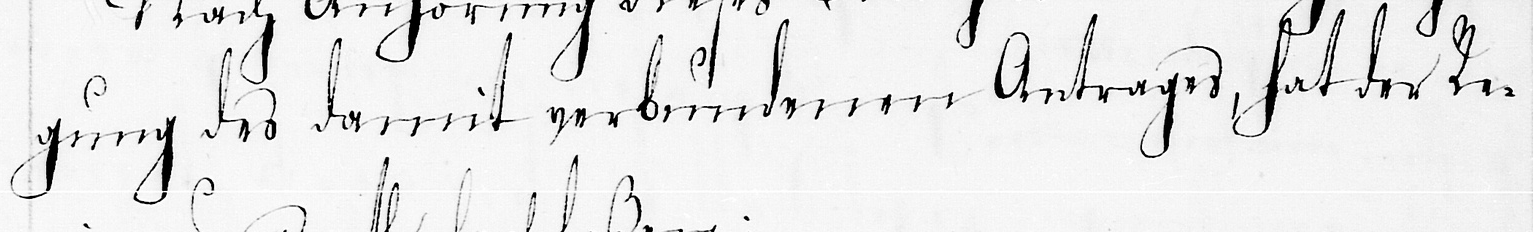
gung des damit verbundenen Antrages, hat der Re¬
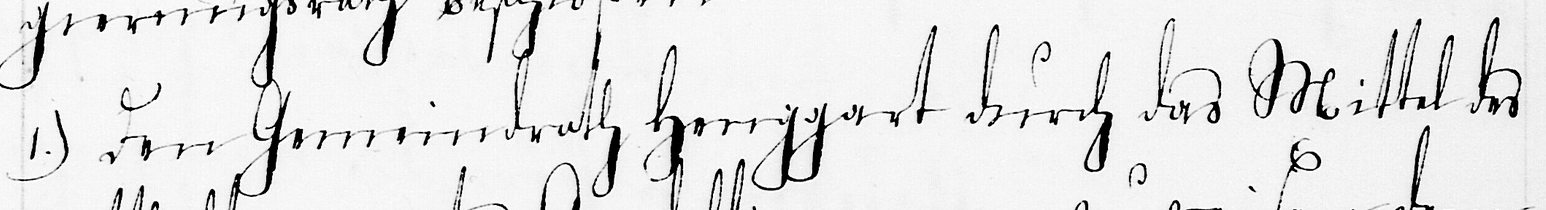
1.) Den Gemeindrath Henggart durch das Mittel des
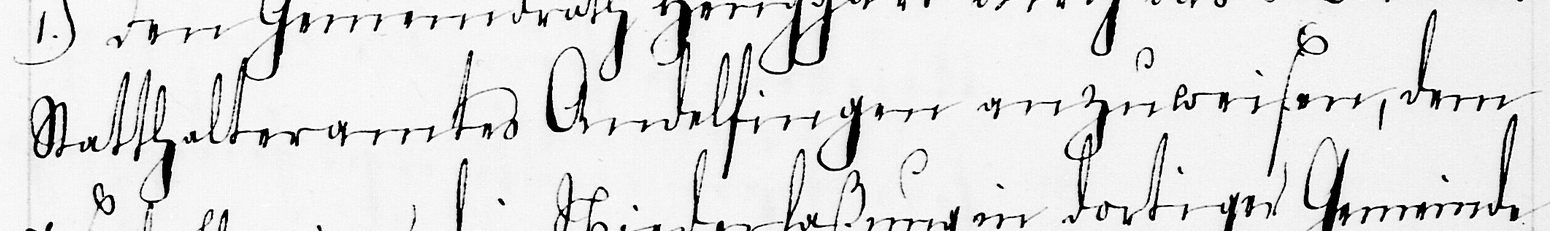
Statthalteramtes Andelfingen anzuweisen, dem
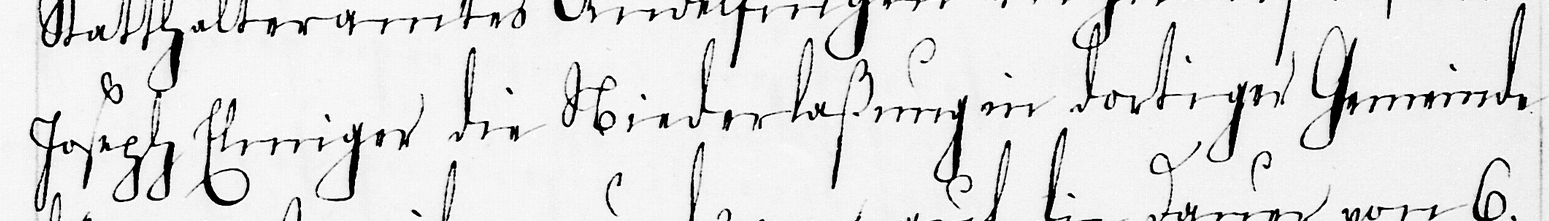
Joseph Elmiger die Niederlaßung in dortiger Gemeinde
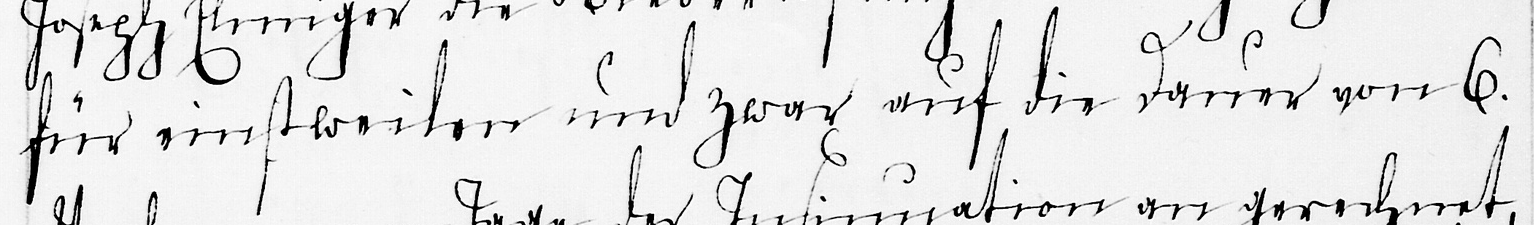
für einstweilen und zwar auf die Dauer von 6.
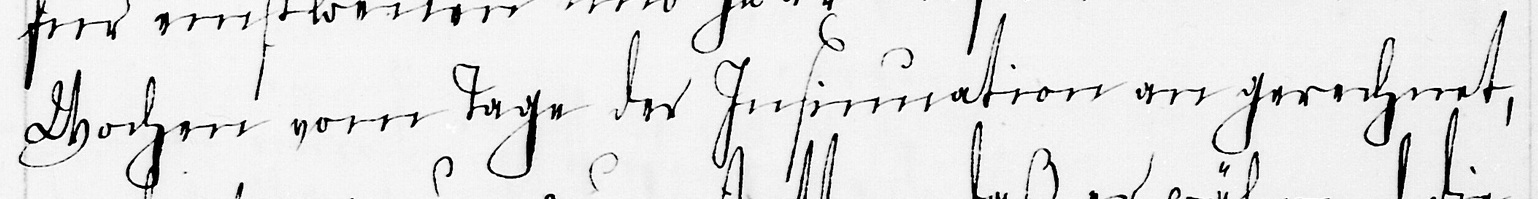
Wochen vom Tage der Insinuation an gerechnet,
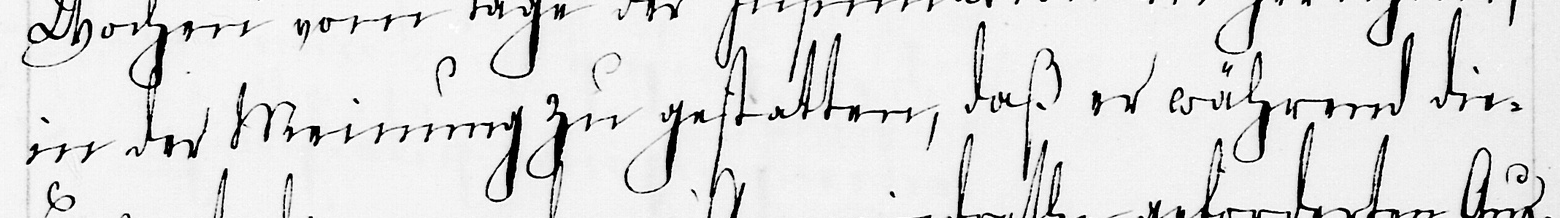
in der Meinung zu gestatten, daß er während die¬
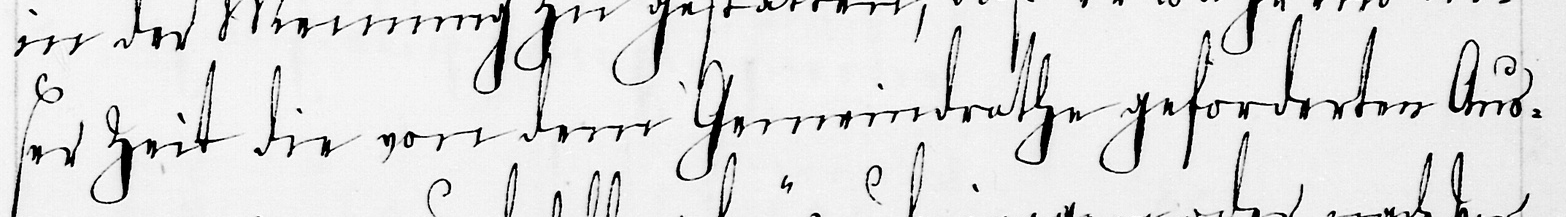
ser Zeit die von dem Gemeindrathe geforderten Aus¬
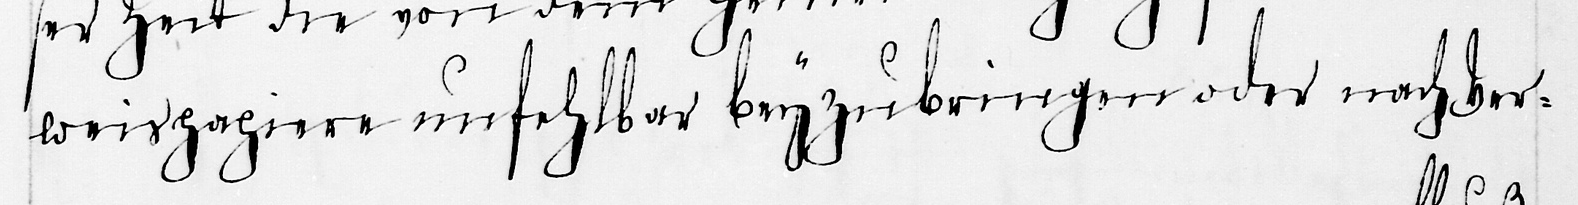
weispapiere unfehlbar beyzubringen oder nach Ver-
